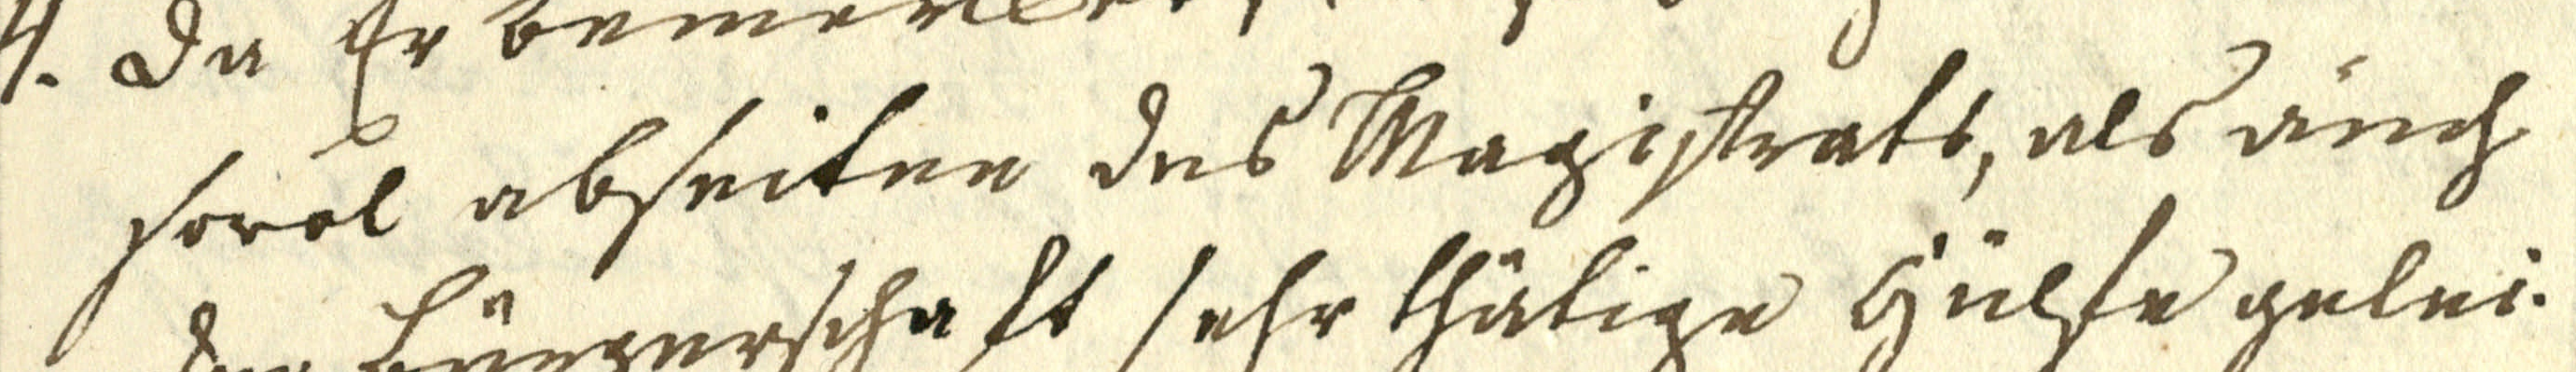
sowol abseiten des Magistrats, als auch
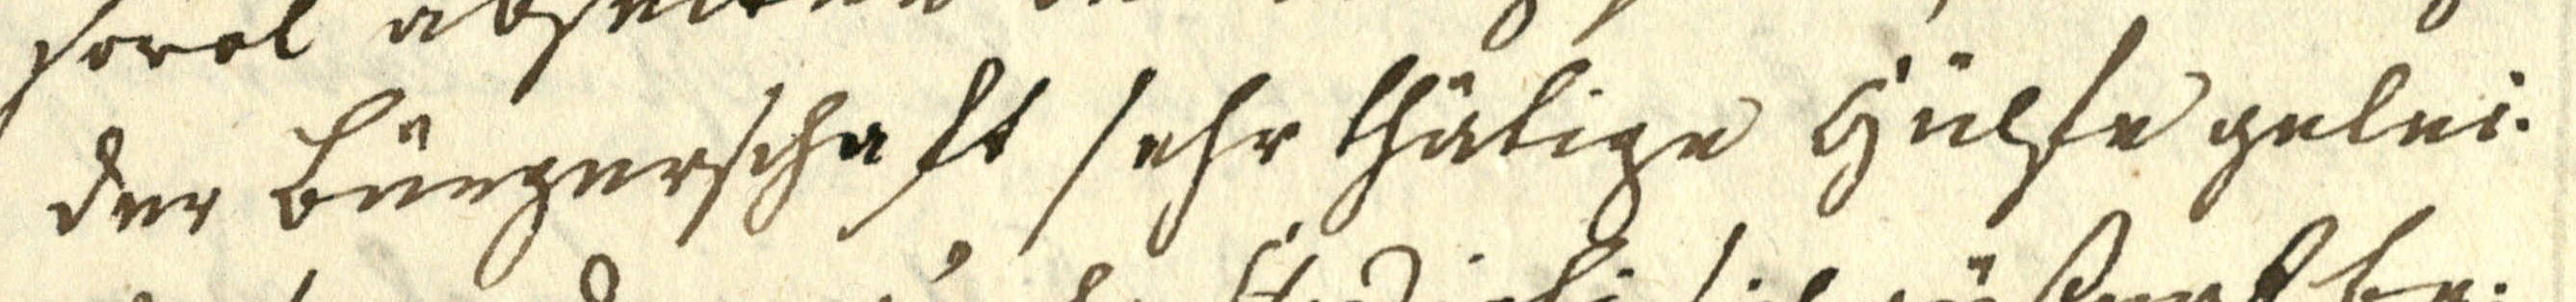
der Bürgerschaft sehr thätige Hülfe gelei¬
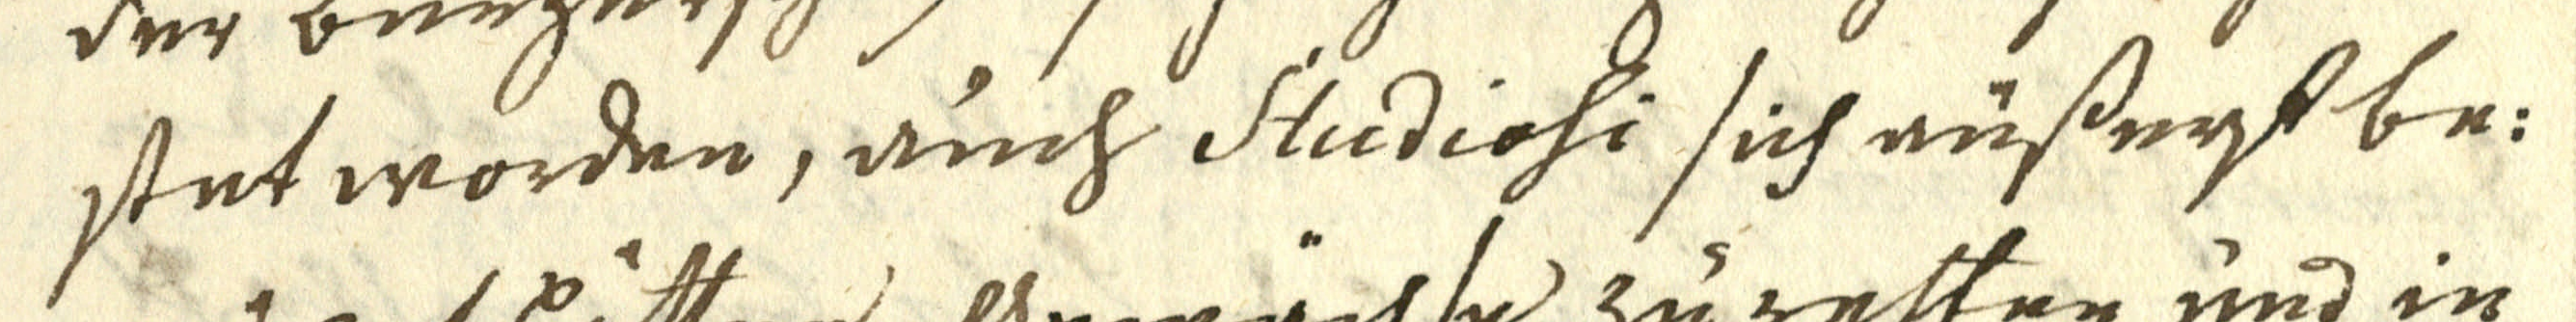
stet worden, auch Studiosi sich äußerst be¬
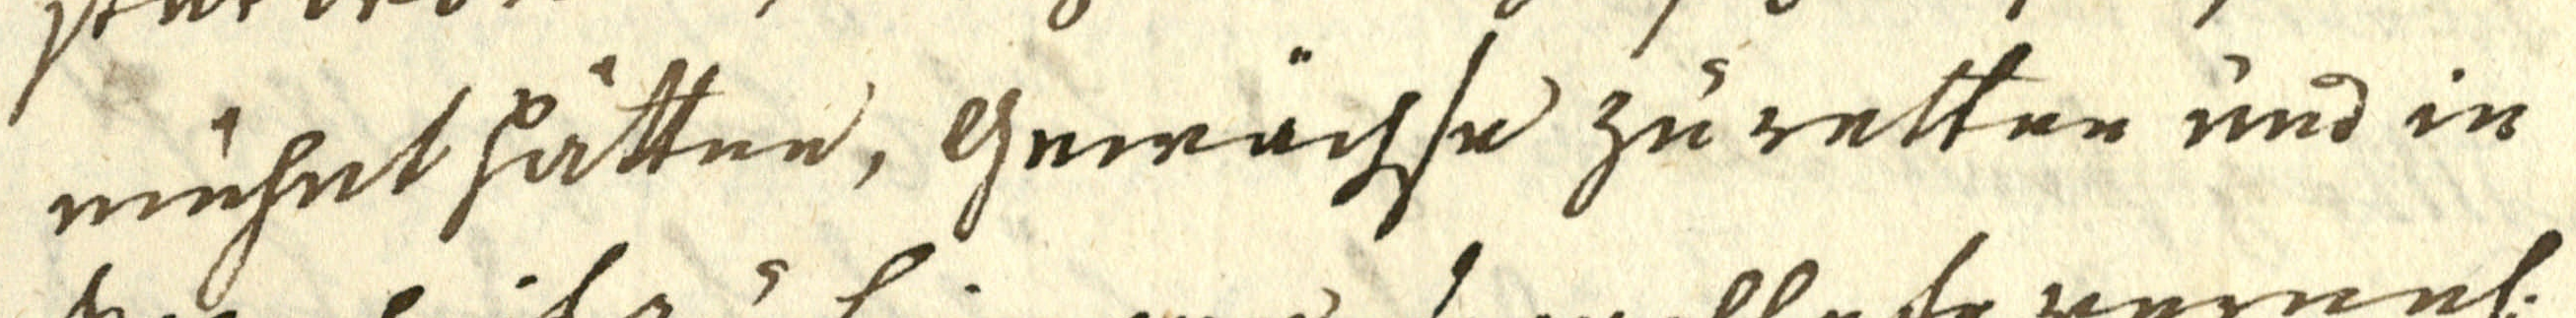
mühet hätten, Gewächse zu retten und in
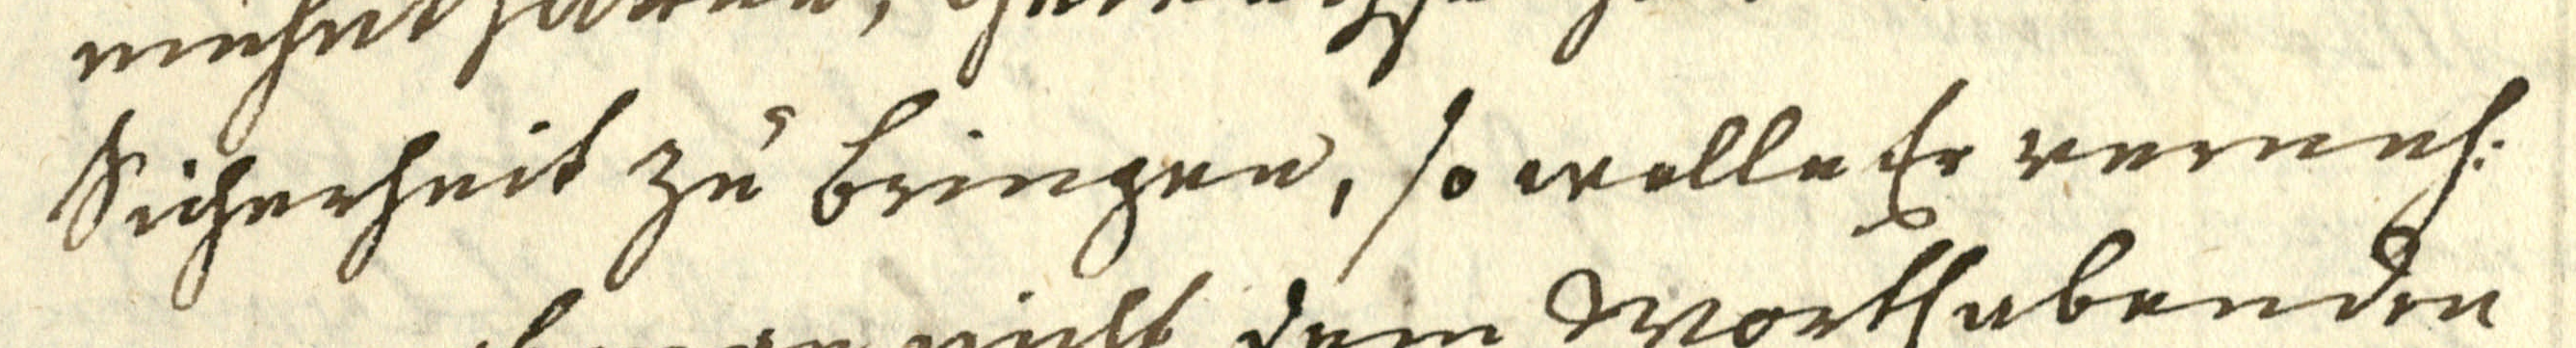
Sicherheit zu bringen, so wolle Er verneh¬
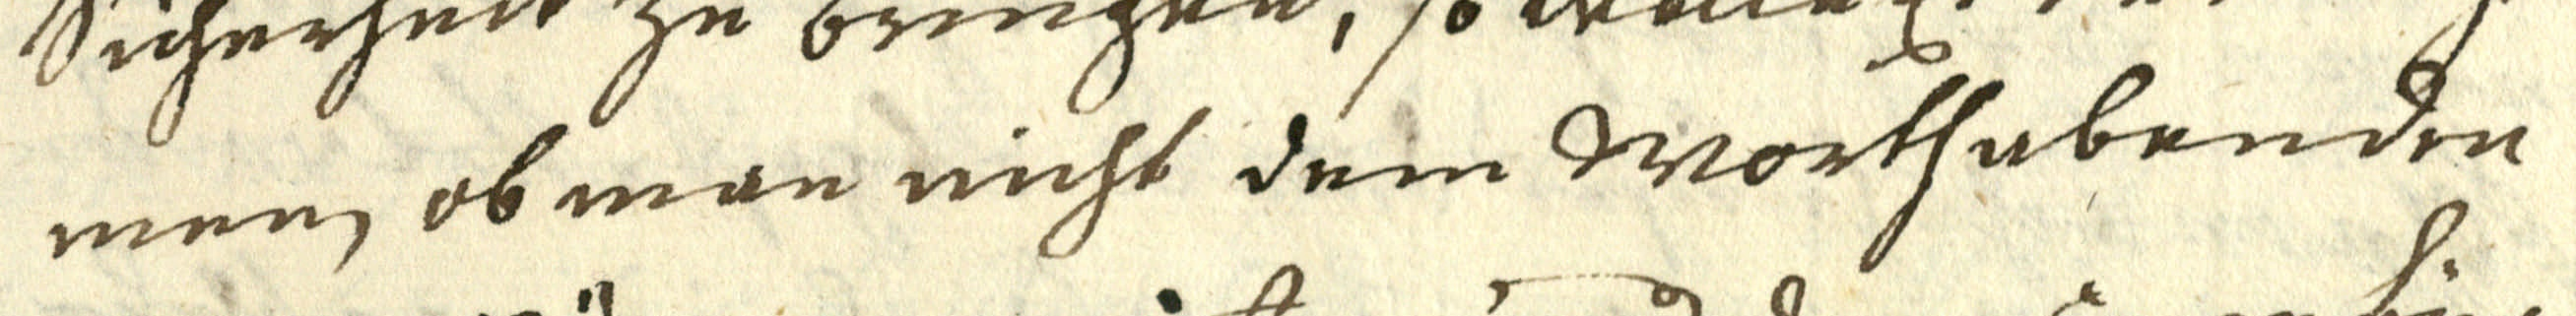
men, ob man nicht dem worthabenden
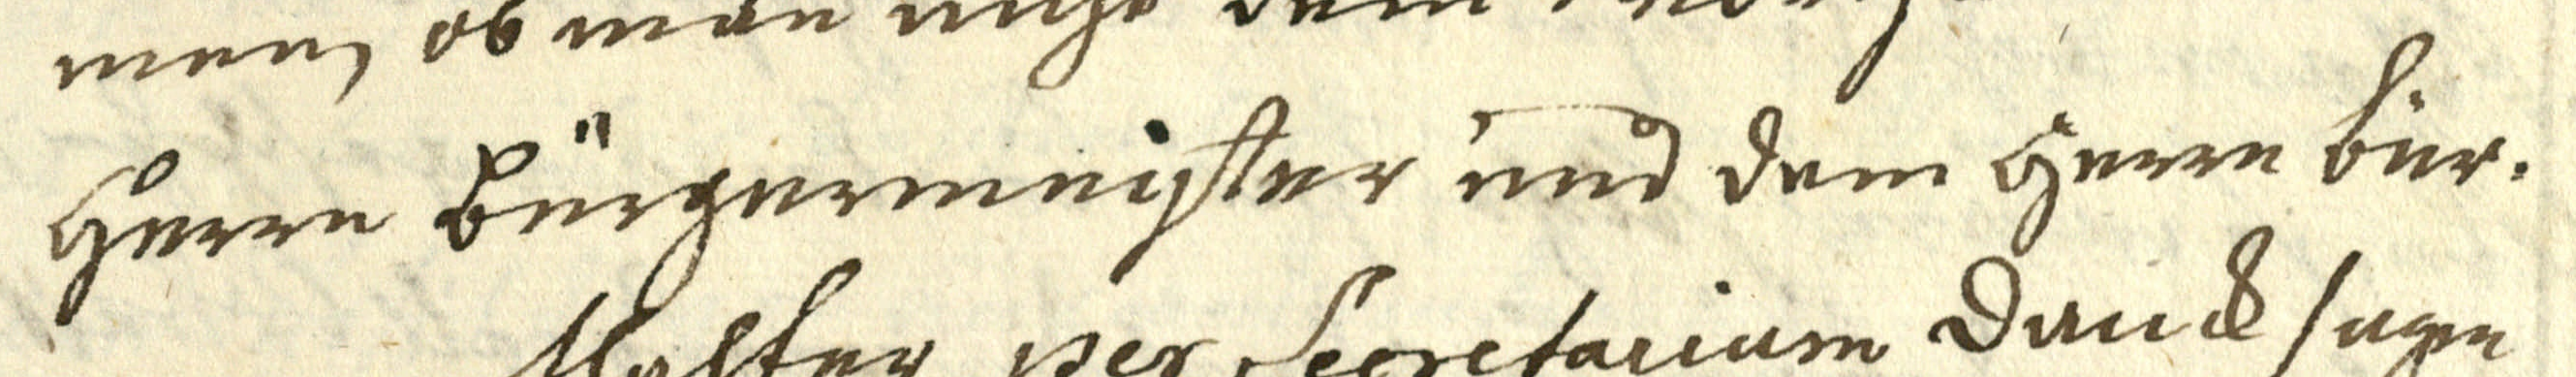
Herrn Bürgermeister und dem Herrn Bürer¬
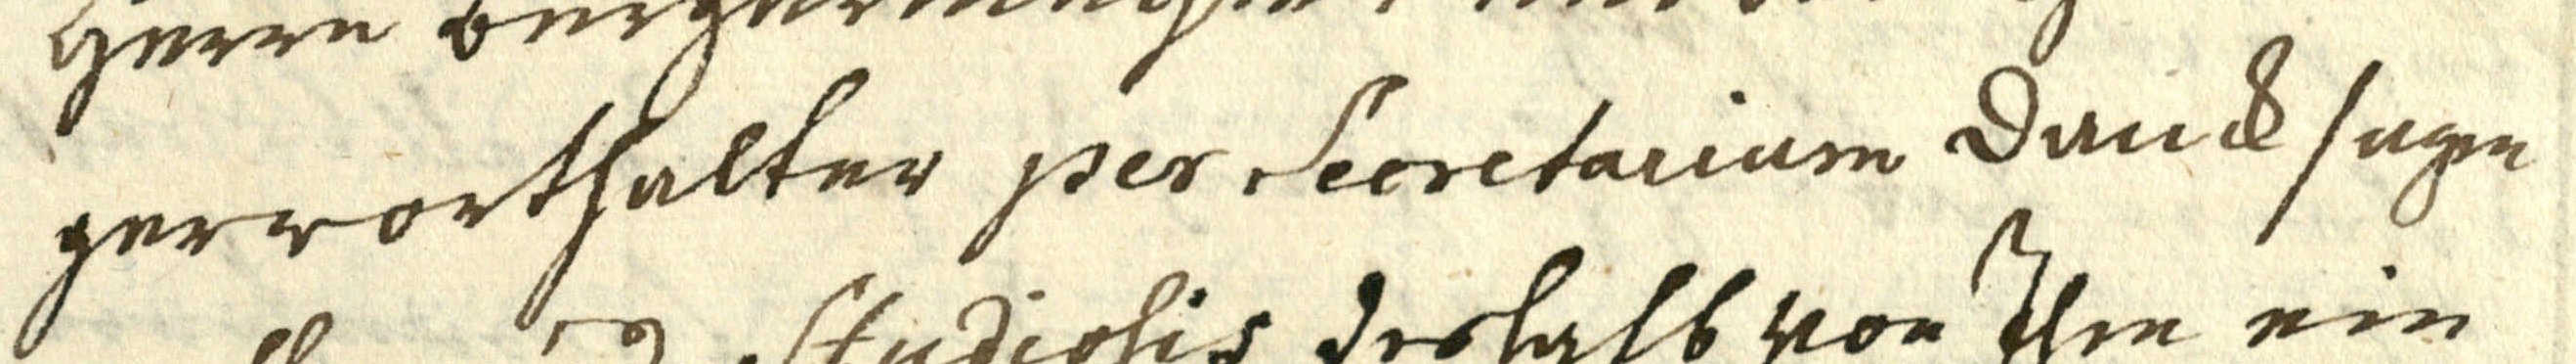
gerworthalter per Secretarium Dank sagen
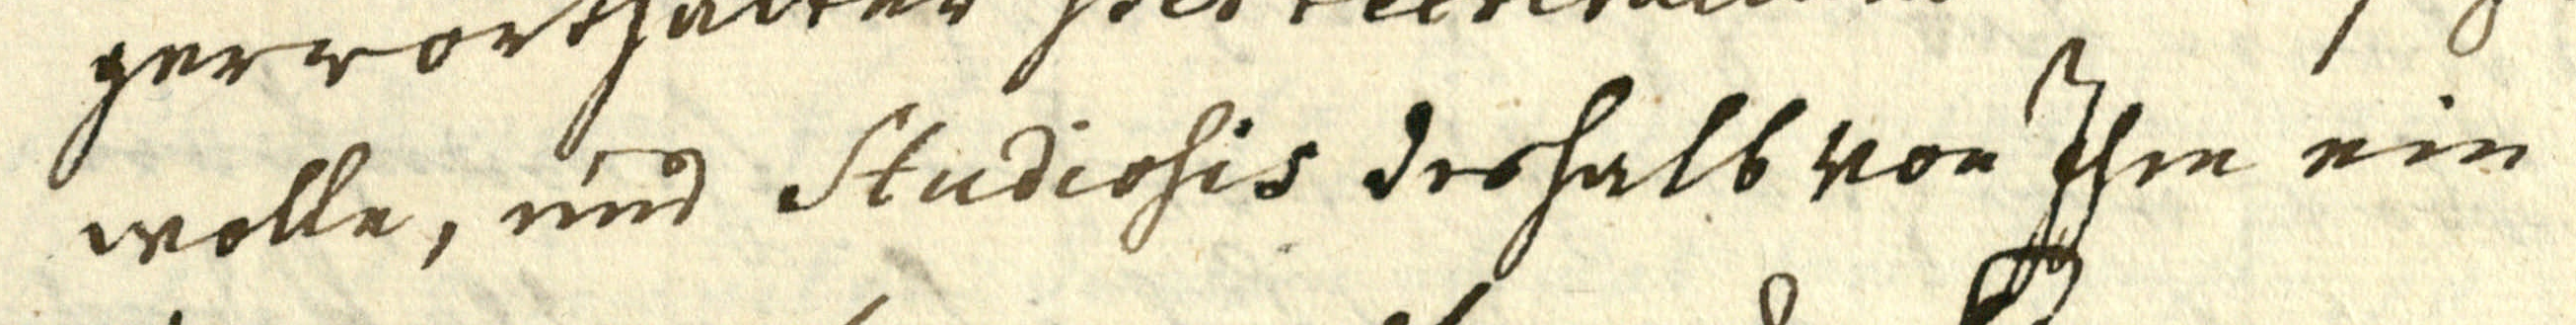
wolle, und Studiosis deshalb von Ihm ein
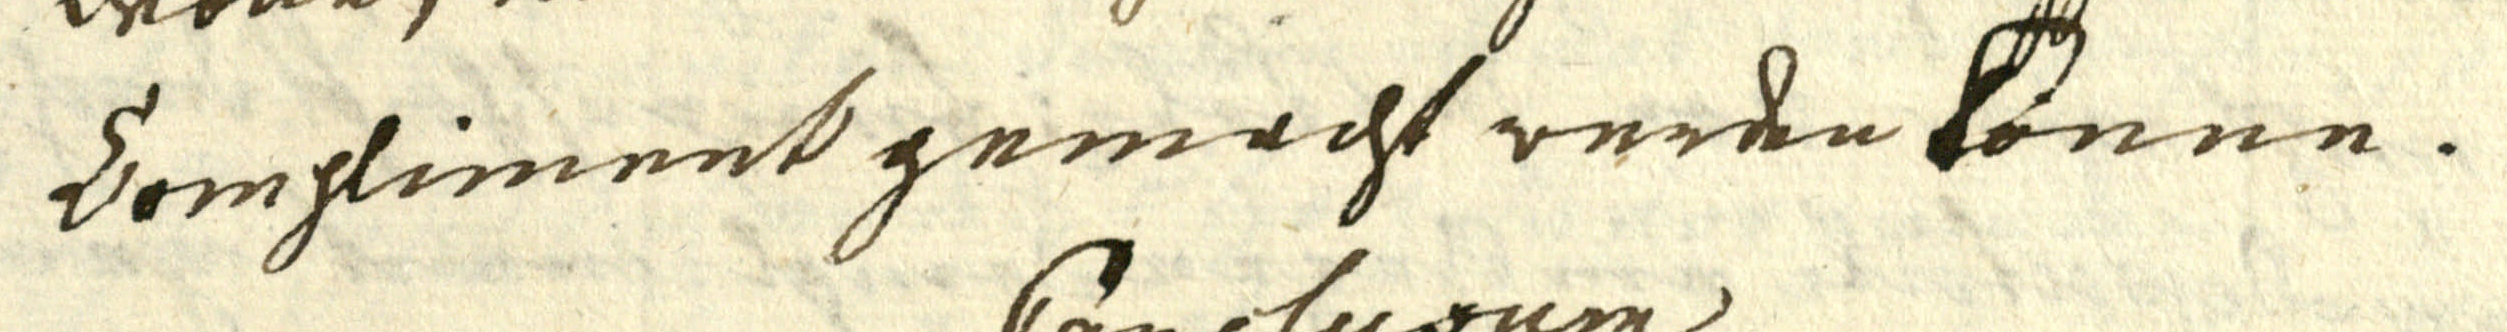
Compliment gemacht werden könne.
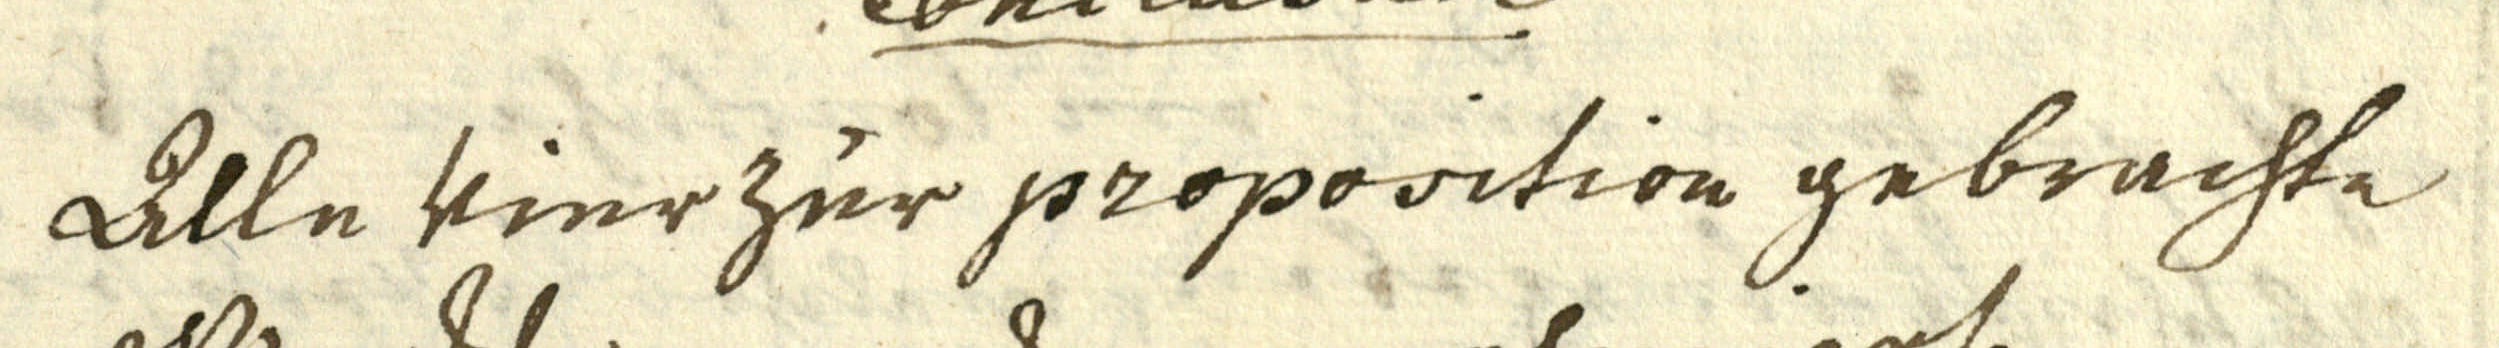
Alle vier zur proposition gebrachte
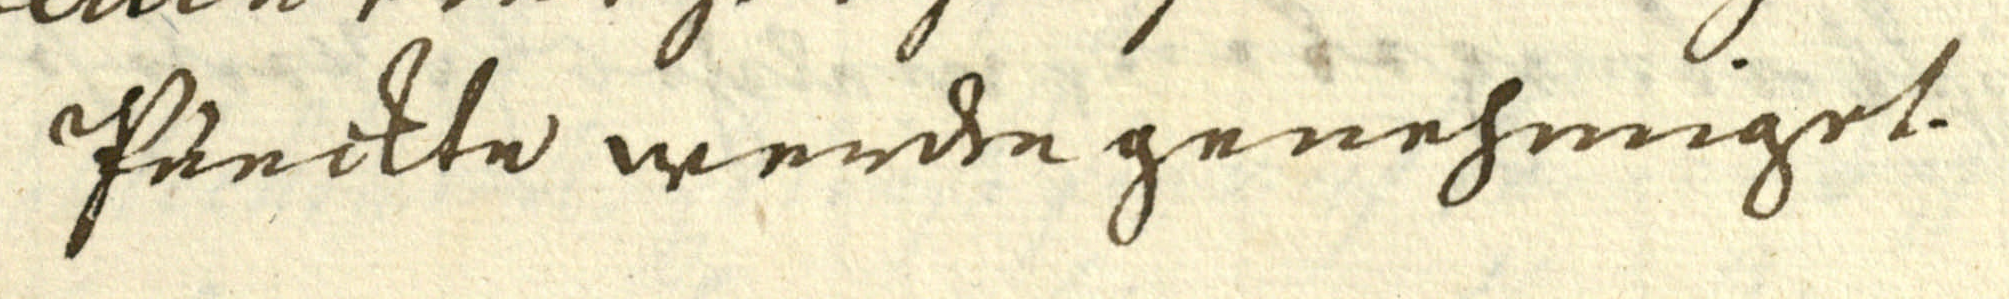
Puncte werden genehmiget.
